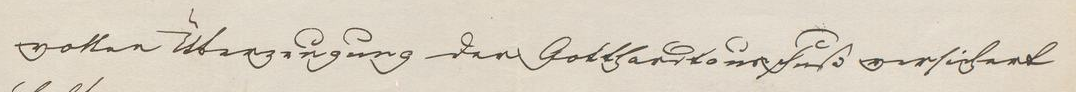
vollen Überzeugung der Gotthardtausschuß versichert
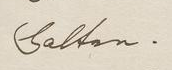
halten.
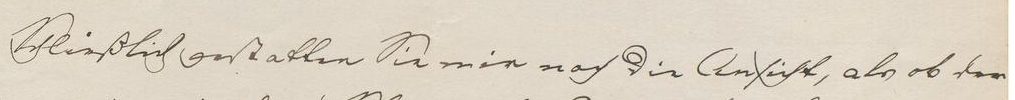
Schließlich gestatten Sie mir noch die Ansicht, als ob der
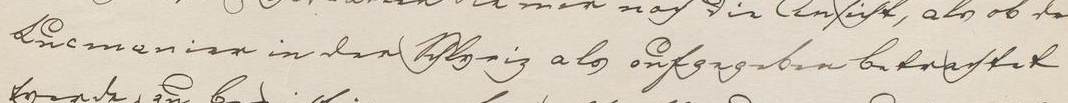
Lucmanier in der Schweiz als aufgegeben betrachtet
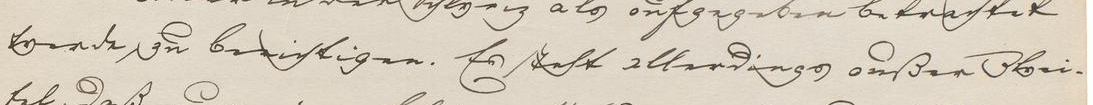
werde, zu berichtigen. Es steht allerdings außer Zwei-
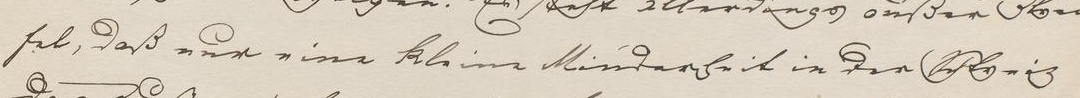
fel, daß nur eine kleine Minderheit in der Schweiz
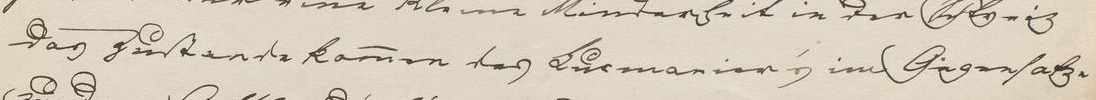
das Zustandekommen des Lucmanier'sim Gegensatze
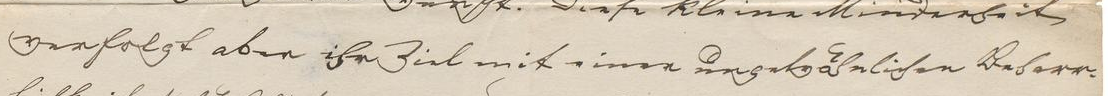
verfolgt aber ihr Ziel mit einer ungewöhnlichen Beharr-
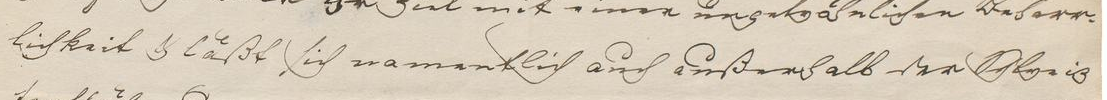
lichkeit & läßt sich namentlich auch außerhalb der Schweiz
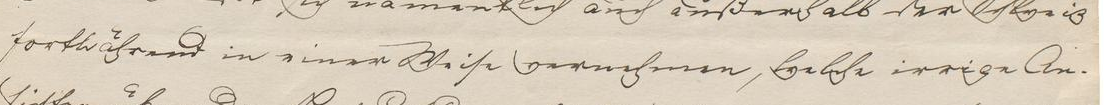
fortwährend in einer Weise vernehmen, welche irrige An-
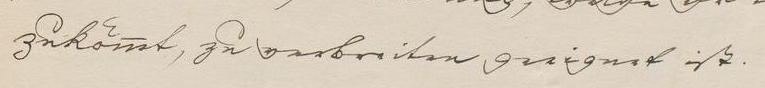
zukommt, zu verbreiten geeignet ist.
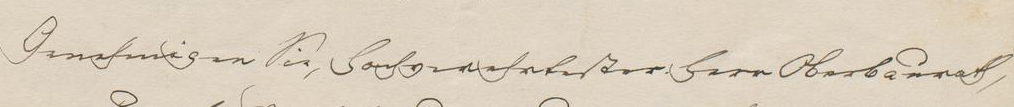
Genehmigen Sie, hochverehrtester Herr Oberbaurath,
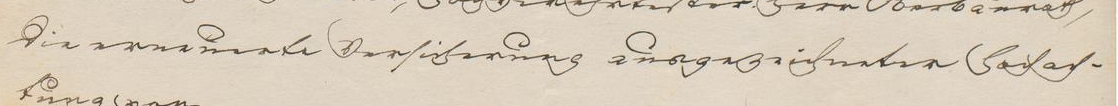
die erneuerte Versicherung ausgezeichneter Hochach-
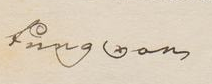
tung von
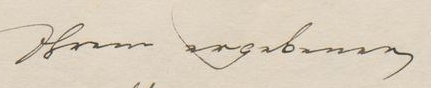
Ihrem ergebenen
